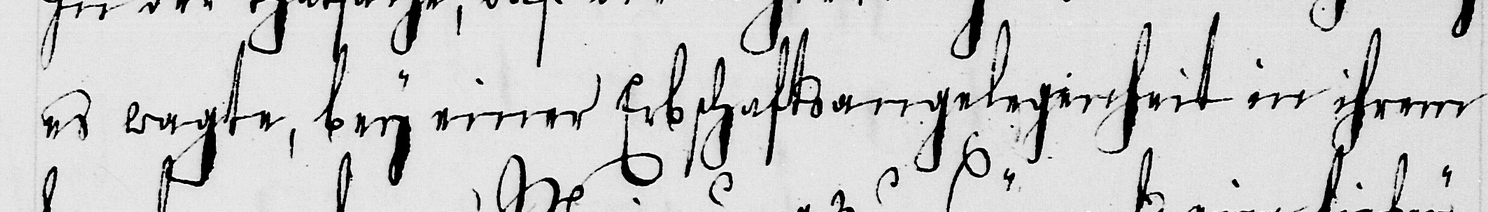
es wagte, bey einer Erbschaftsangelegenheit in ihrem
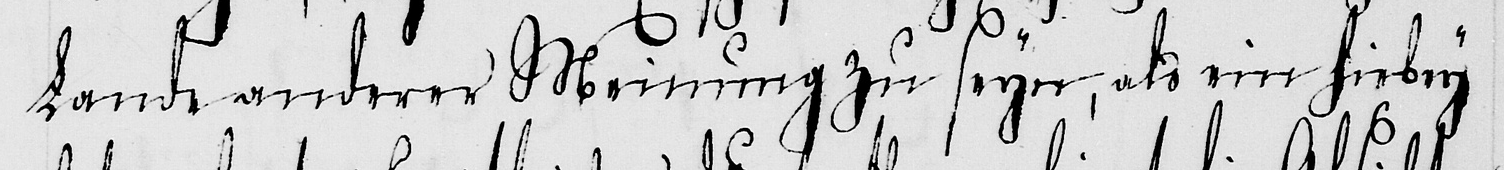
Lande anderer Meinung zu seyn, als ein hiebey
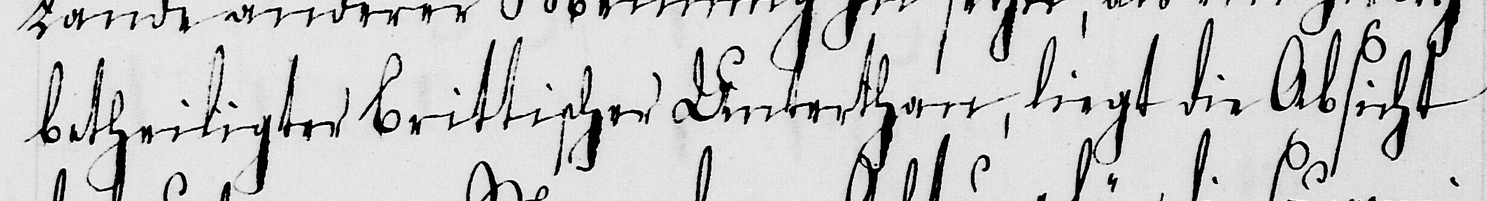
betheiligter Brittischer Unterthan, liegt die Absicht
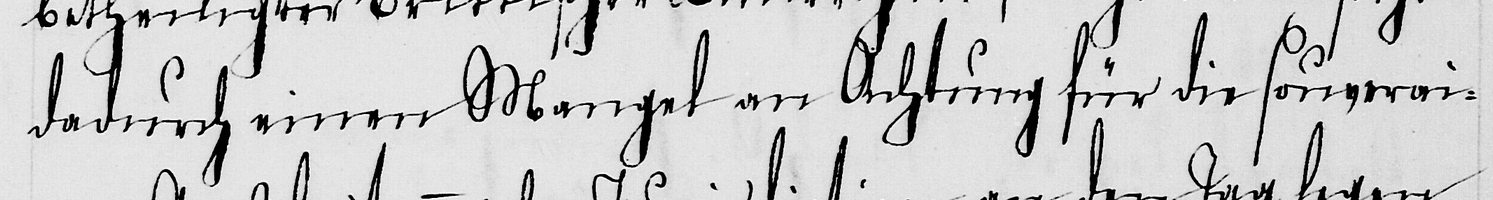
dadurch einen Mangel an Achtung für die souverai¬
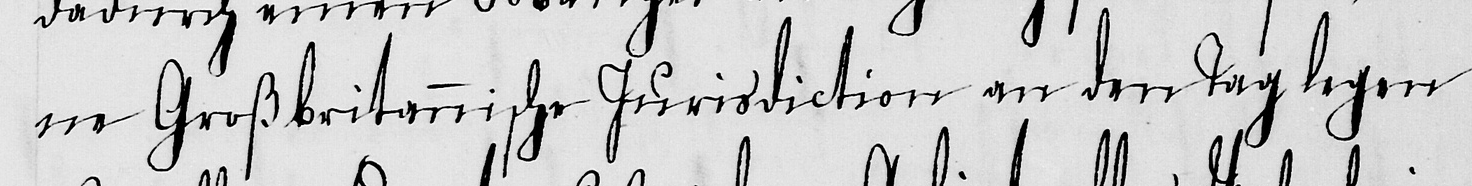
ne Großbritannische Jurisdiction an den Tag legen
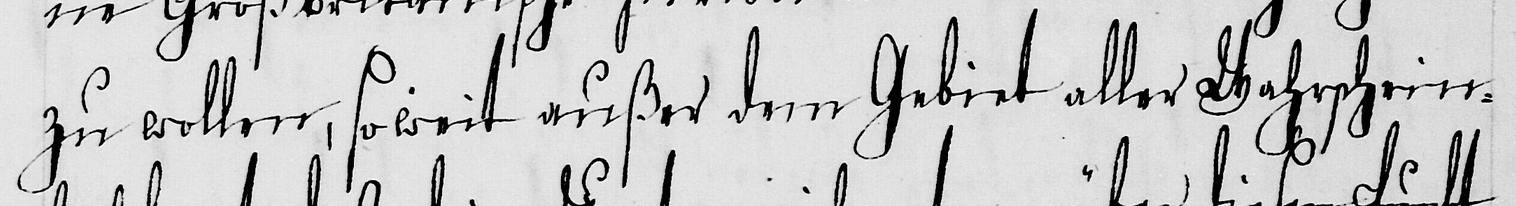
zu wollen, soweit außer dem Gebiet aller Wahrschein¬
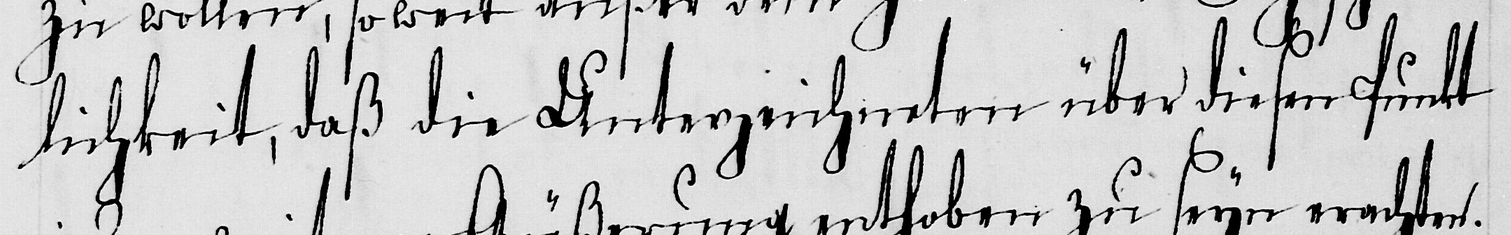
lichkeit, daß die Unterzeichneten über diesen Punkt
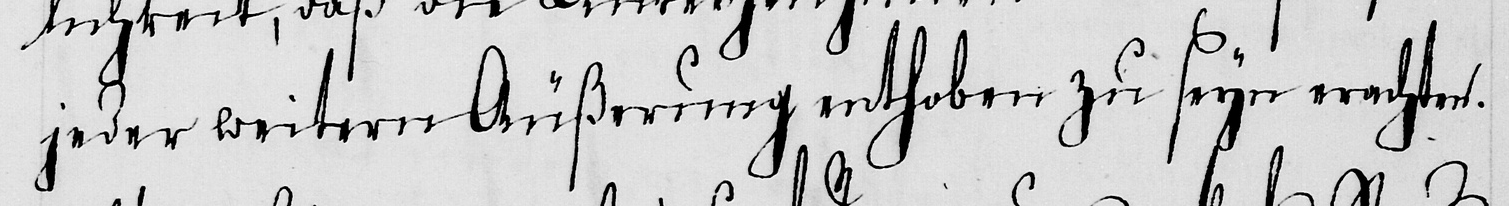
jeder weiteren Äußerung enthoben zu seyn erachten.
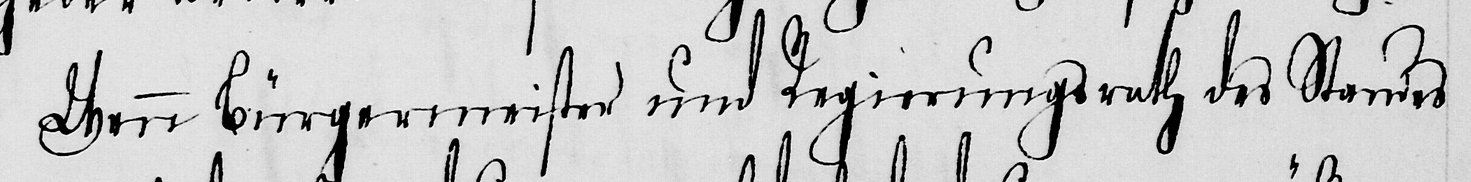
Wenn Bürgermeister und Regierungsrath des Standes
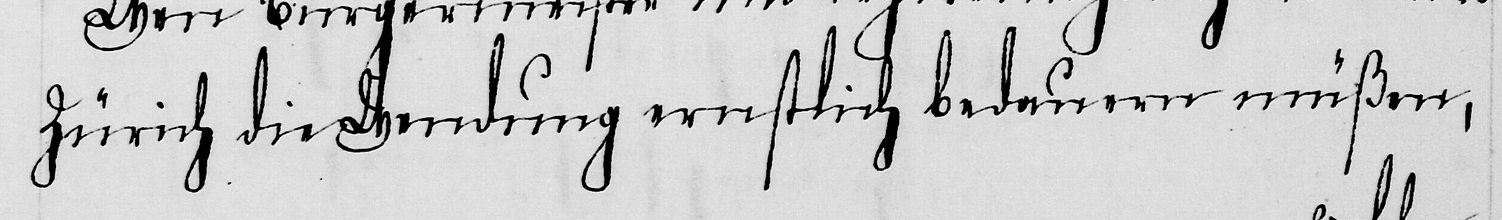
Zürich die Wendung ernstlich bedauern müßen,
